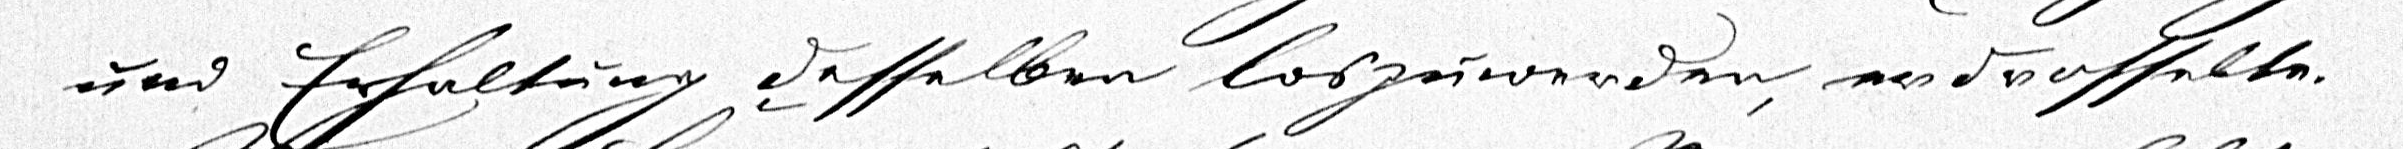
und Erhaltung desselben loszuwerden, erdrosselte.
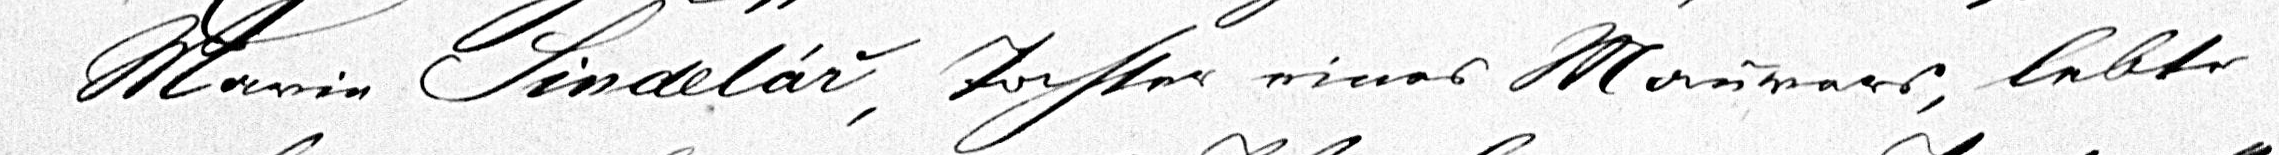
Marie Šindelář, Tochter eines Maurers, lebte
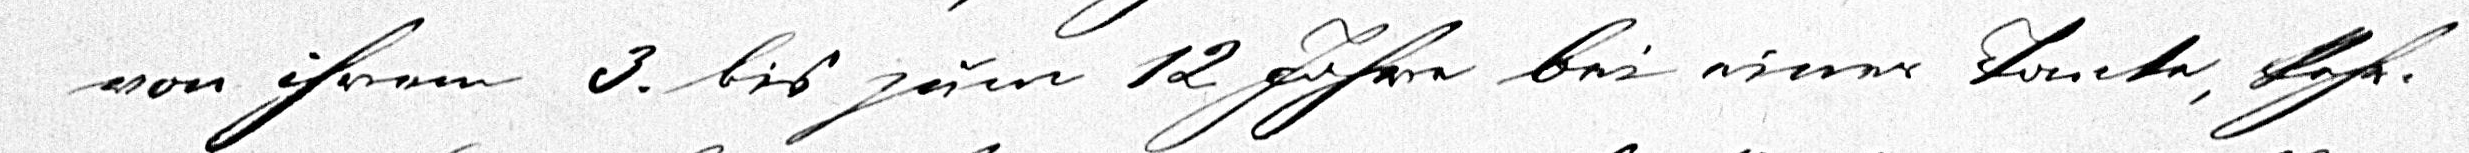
von ihrem 3. bis zum 12 Jahre bei einer Tante, kehr¬
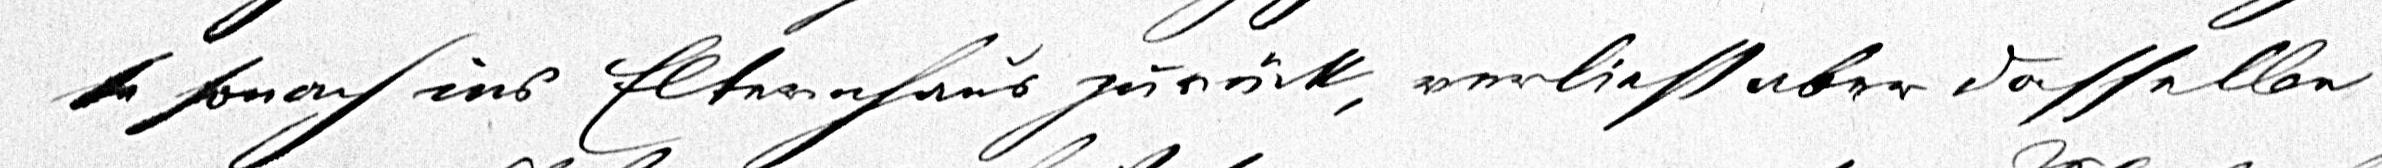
te sonach ins Elternhaus zurück, verließ aber dasselbe
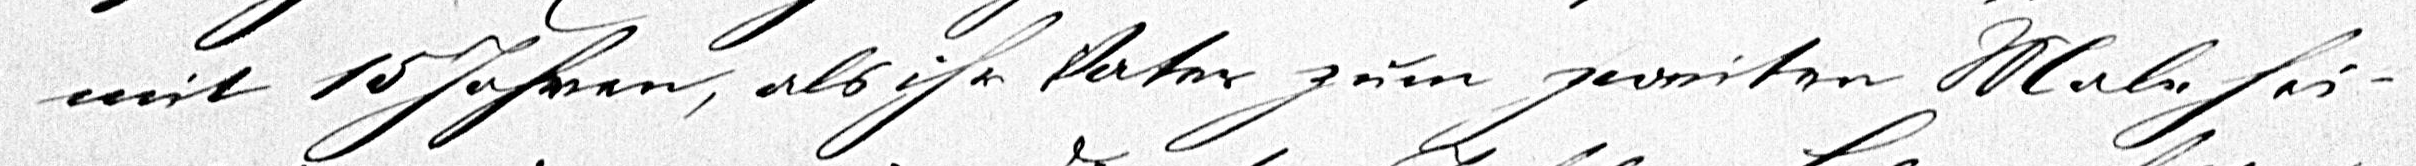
mit 15 Jahren, als ihr Vater zum zweiten Male hei¬
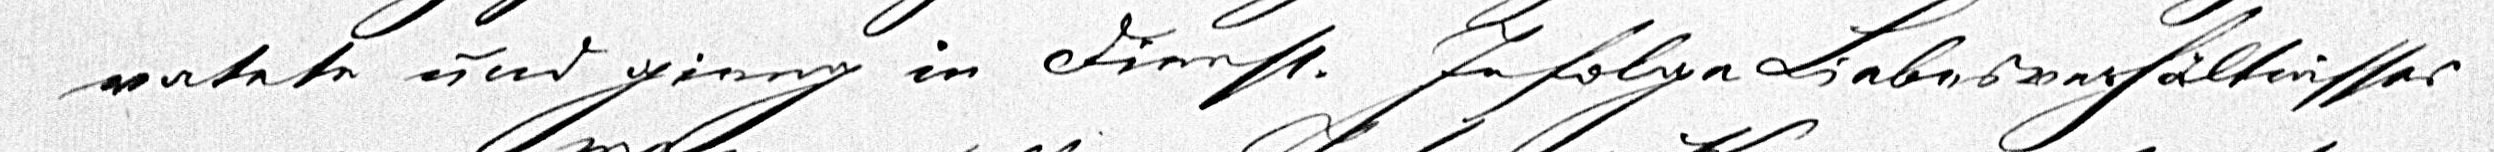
ratete und gixxg in Dienst. Infolge Liebesverhältnisses
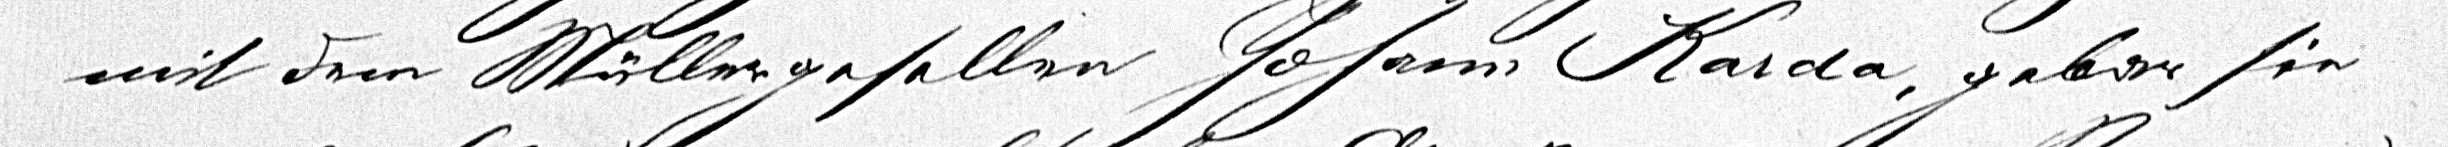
mit dem Müllergesellen Johann Karda, gebar sie
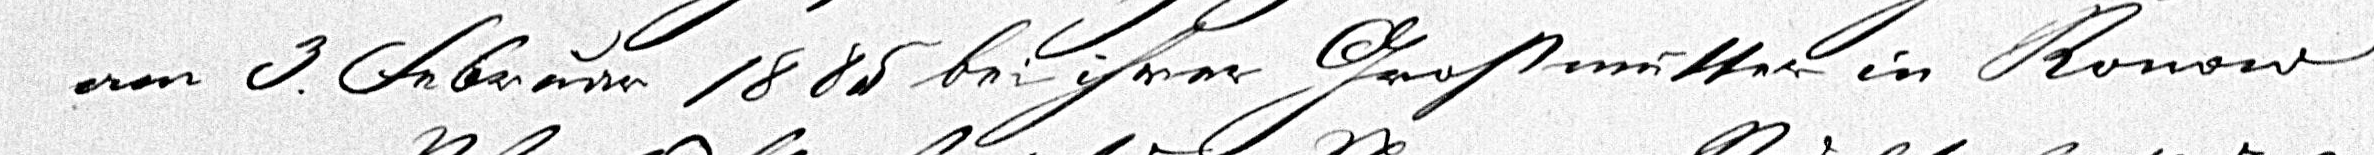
am 3. Februar 1885 bei ihrer Großmutter in Ronow
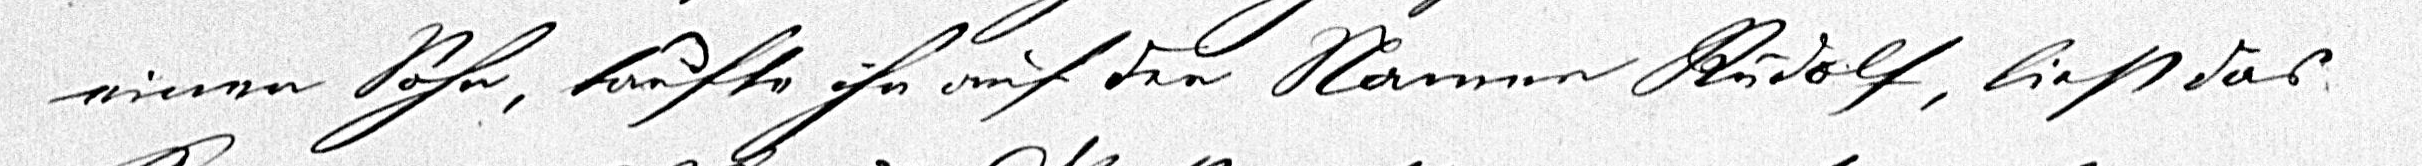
einen Sohn, taufte ihn auf der Namen Rudolf, ließ das
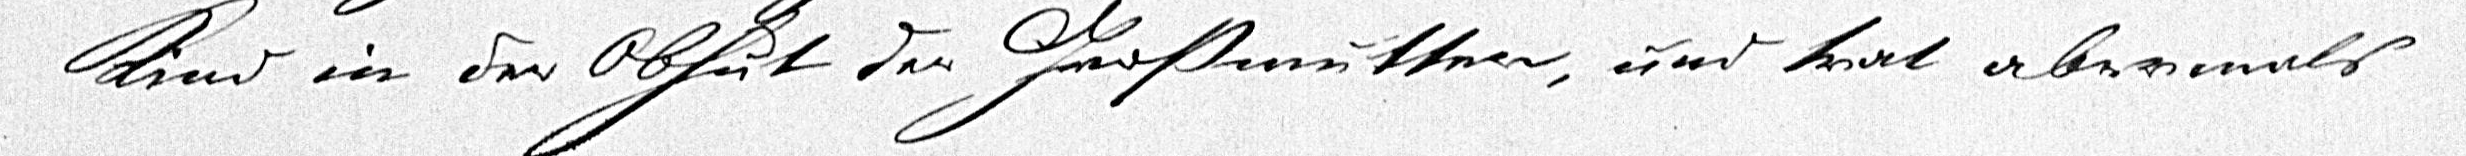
Kind in der Obhut der Großmutter, und trat abermals
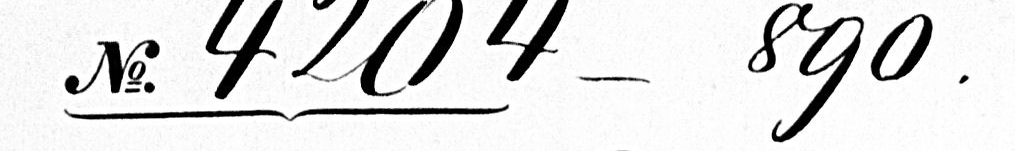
N° 4204- 890.
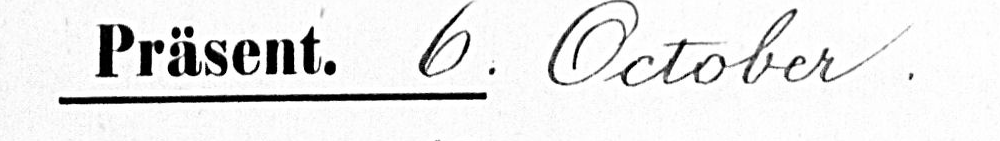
Präsent. 6. October
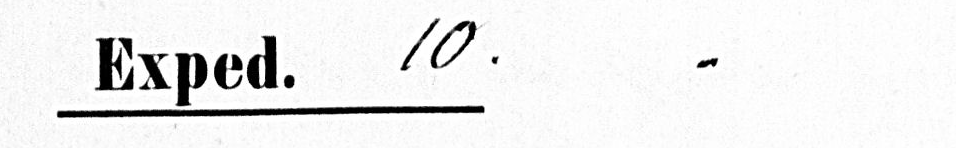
Exped. 10. October
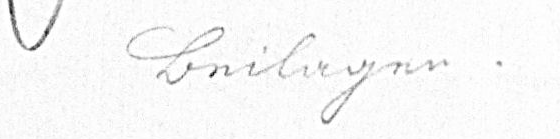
Beilagen.
